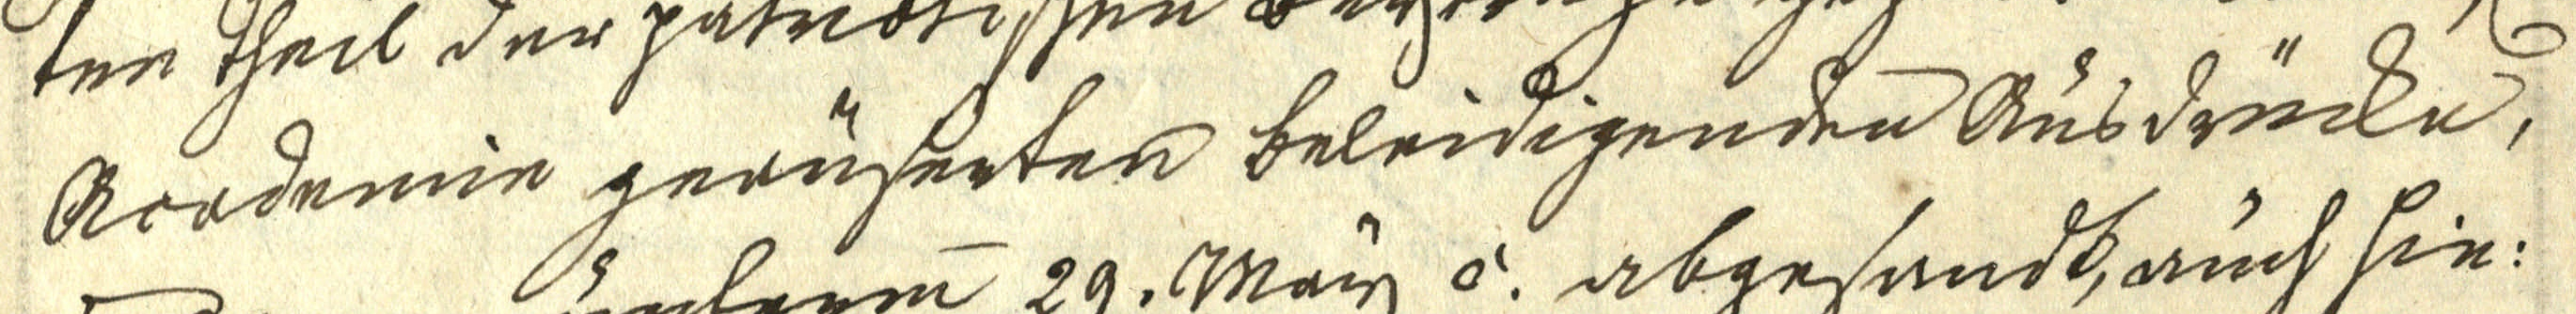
Academie geäußerten beleidigenden Ausdrücke,
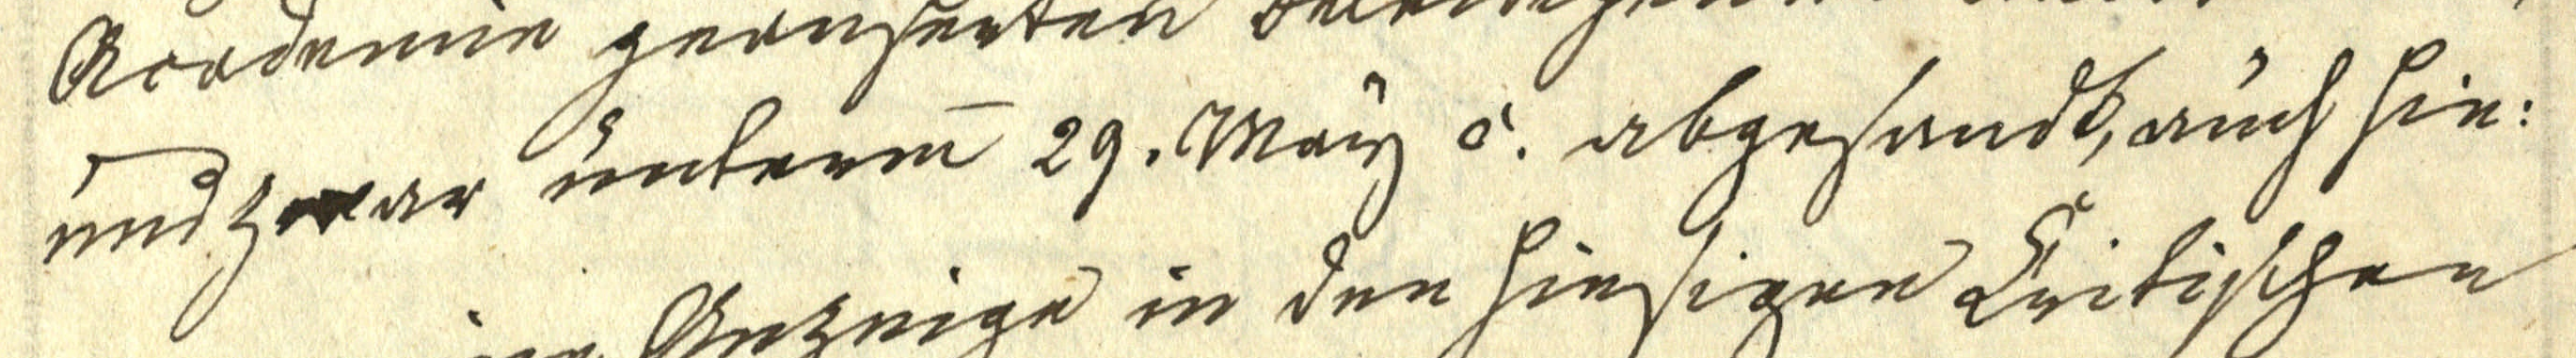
und zwar unterm 29. Maÿ c. abgesandt, auch hie¬
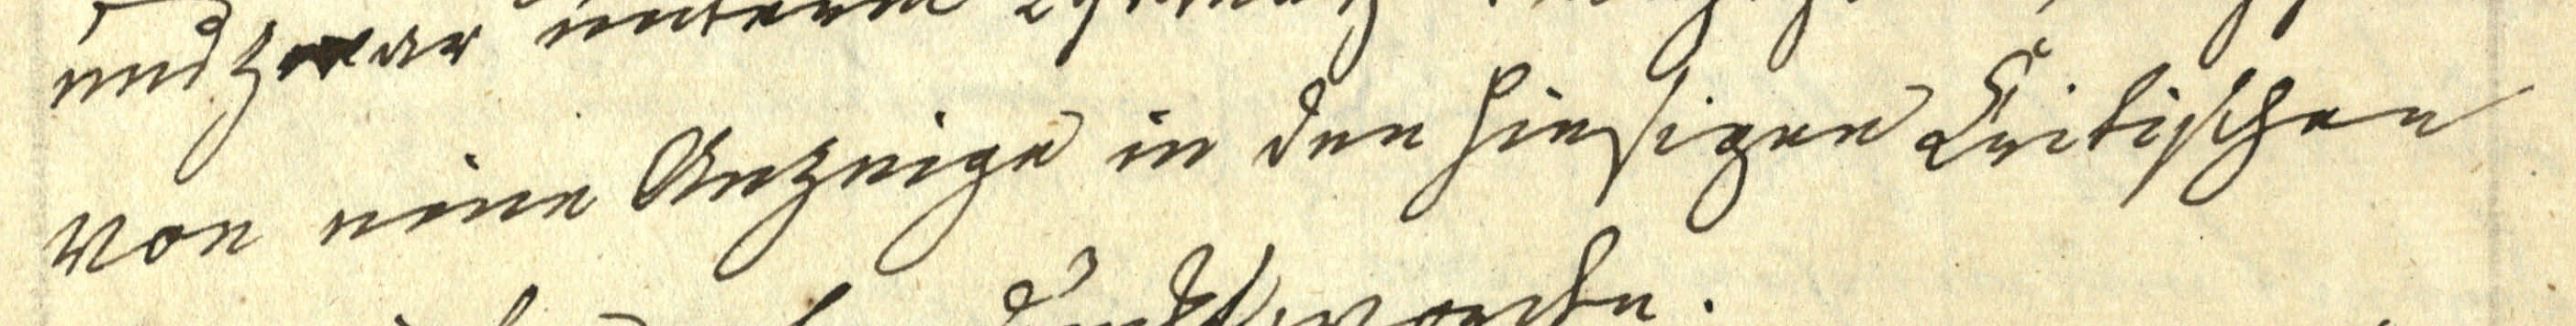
von eine Anzeige in den hiesigen Critischen
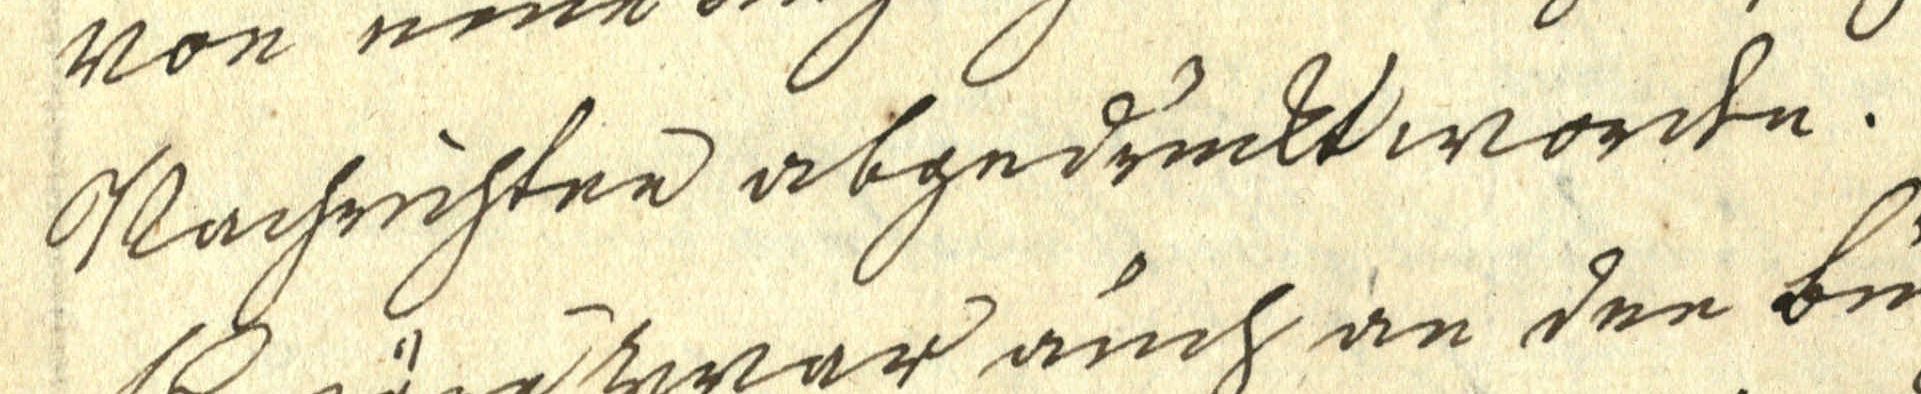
Nachrichten abgedruckt worden.
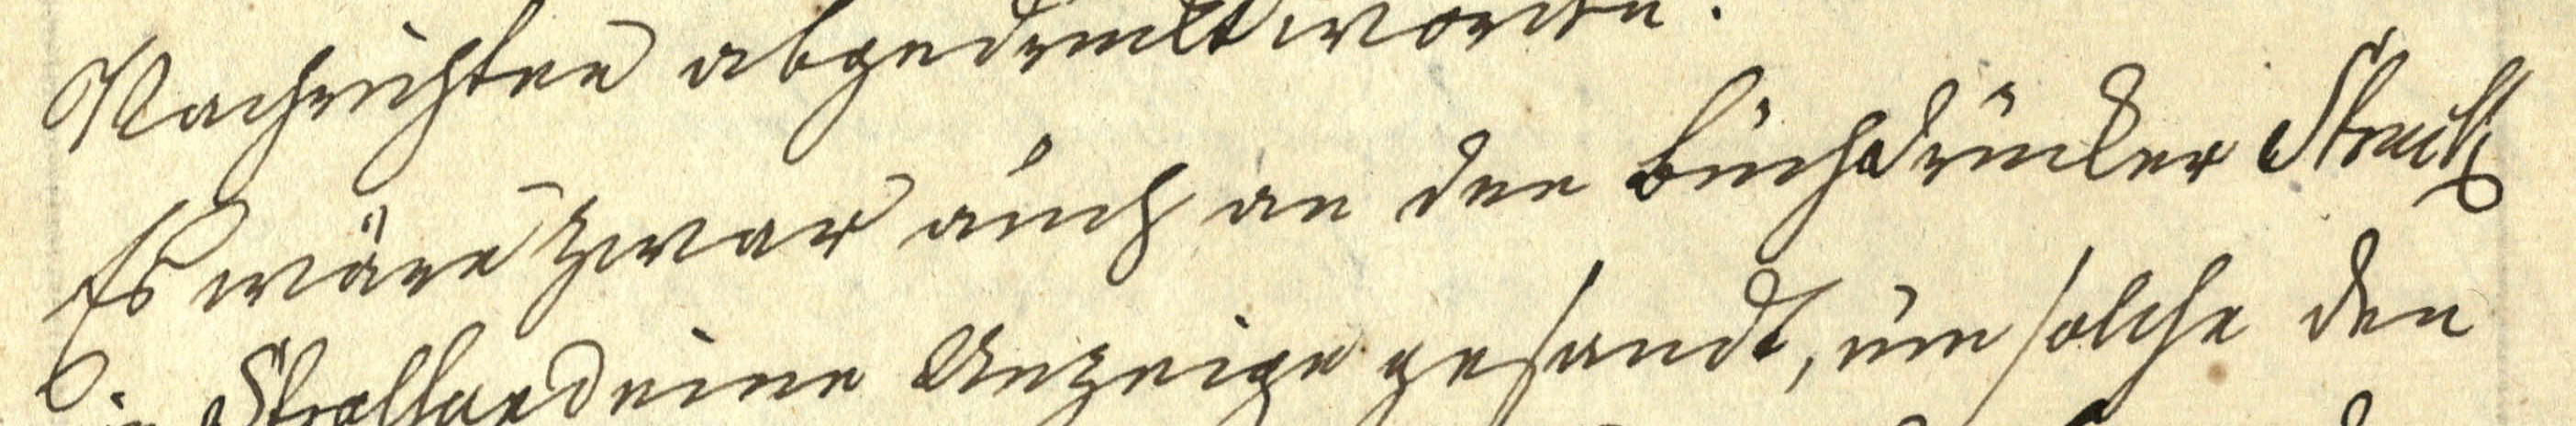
Es wäre zwar auch an den Buchdrucker Struck
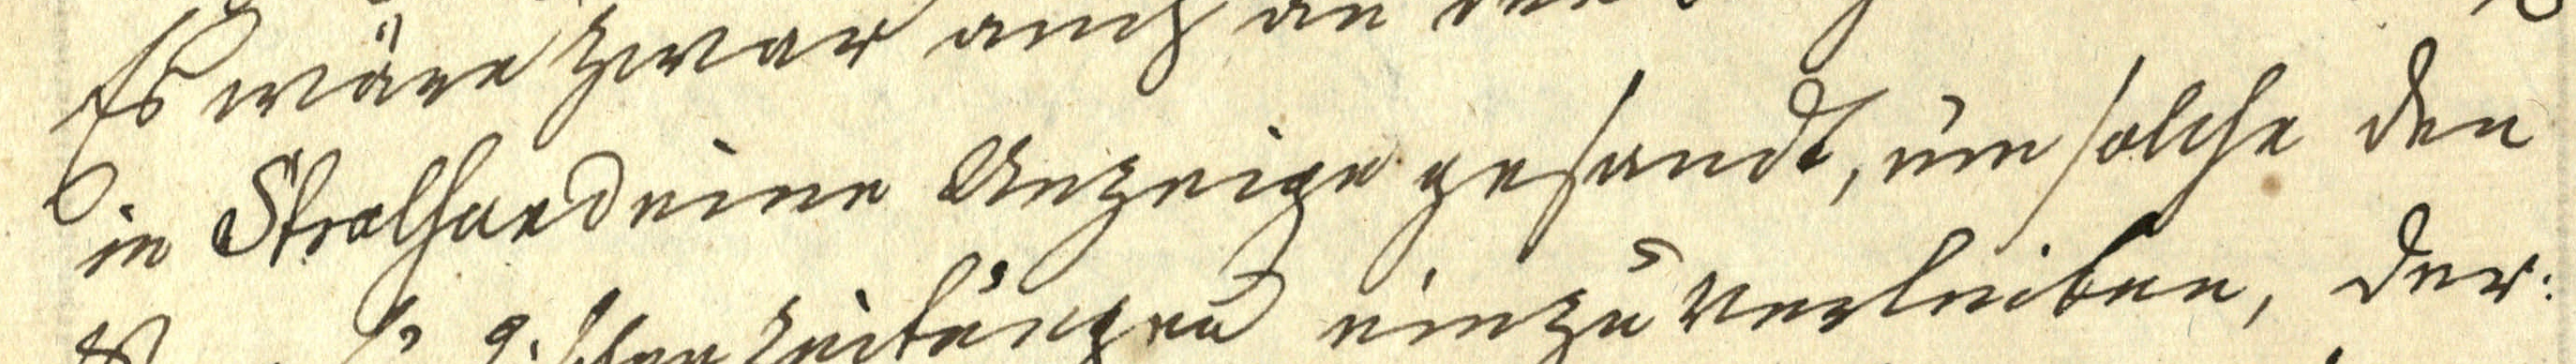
in Stralsund eine Anzeige gesandt, um solche den
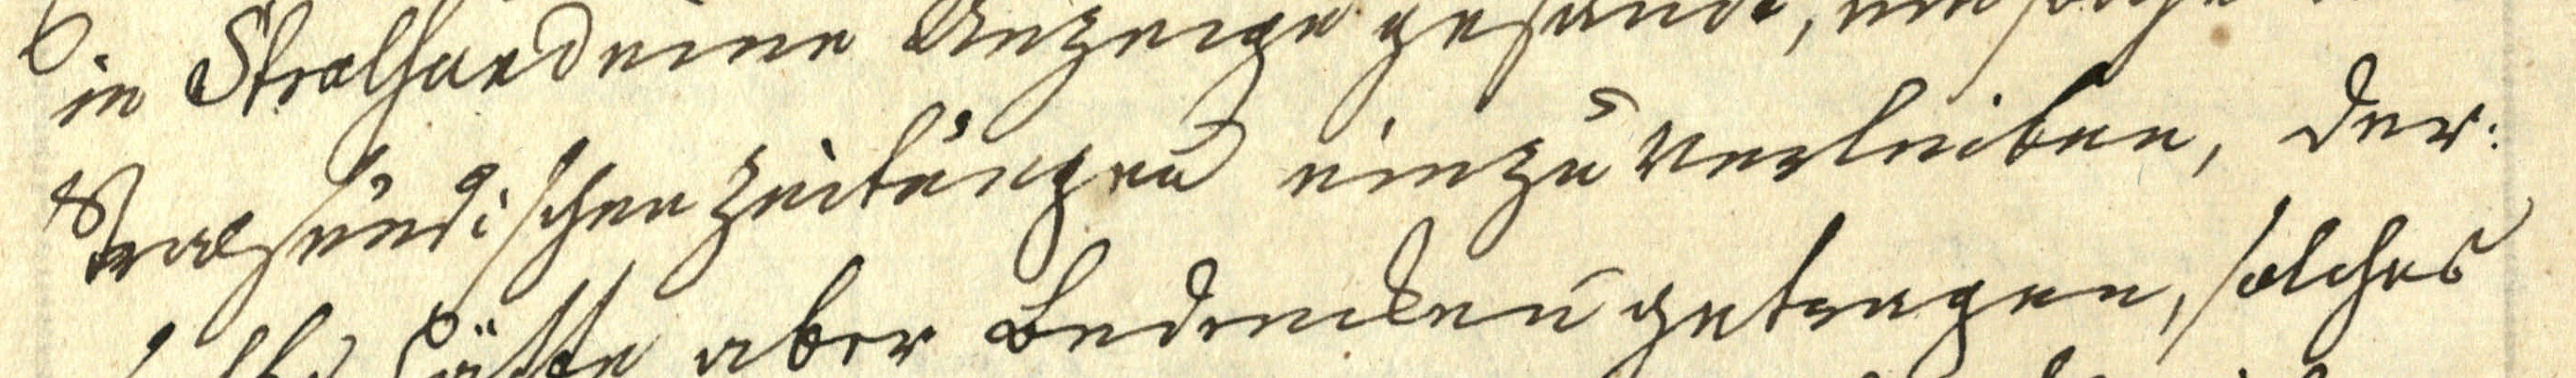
Stralsundischen Zeitungen einzu verbleiben, der¬
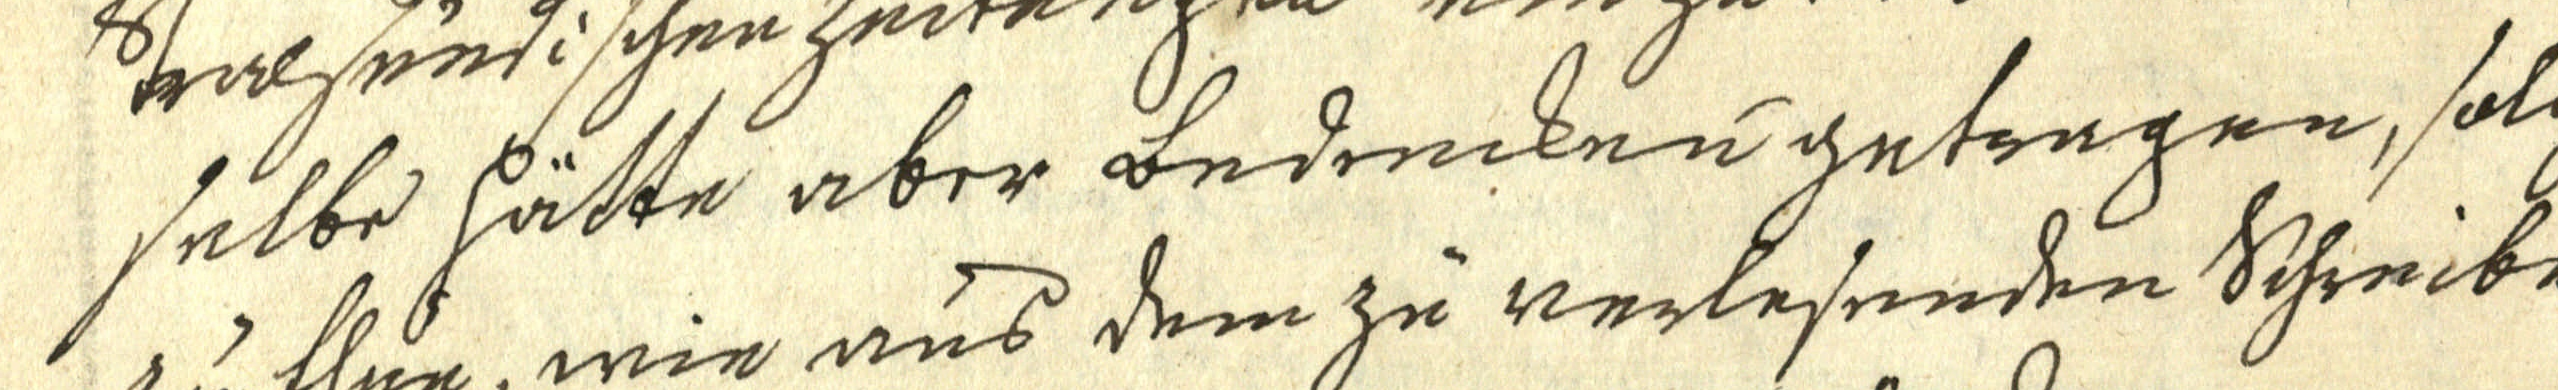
selbe hätte aber Bedencken getragen, solches
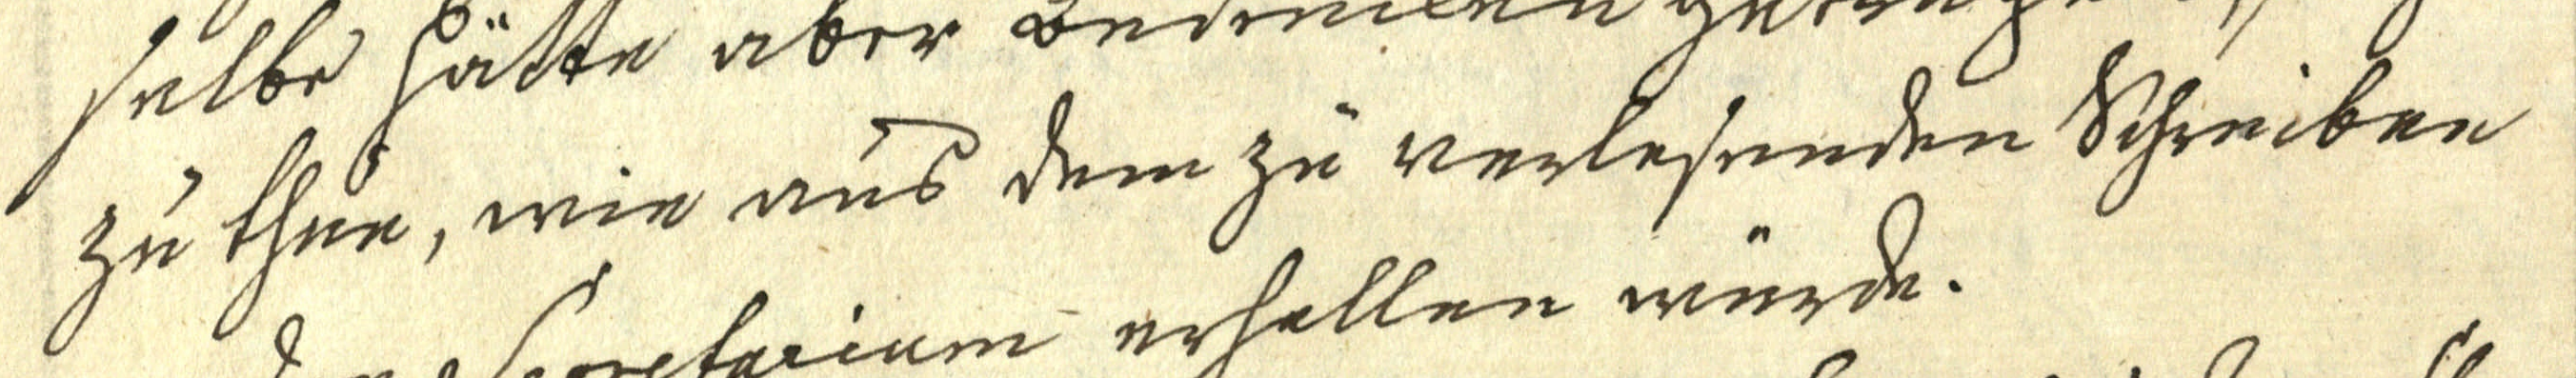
zu thun, wie aus dem zu verlesenden Schreiben
